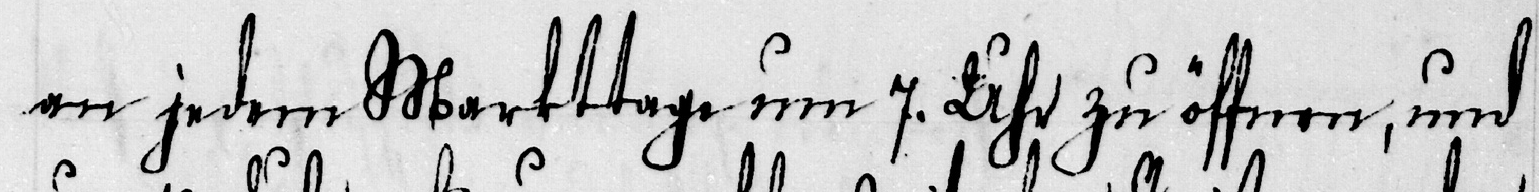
an jedem Markttage um 7. Uhr zu öffnen, und
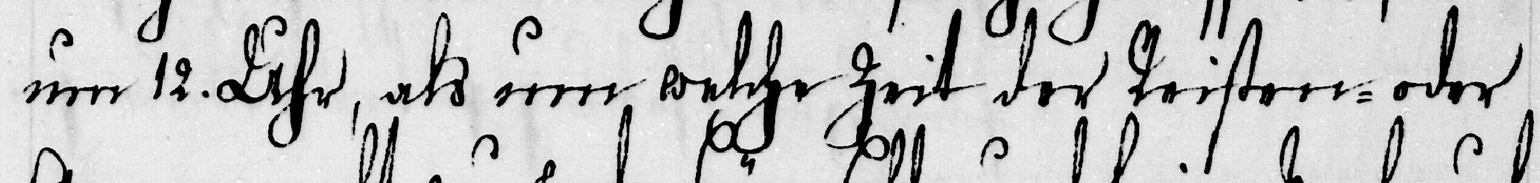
um 12. Uhr, als um welche Zeit der Reisten- oder
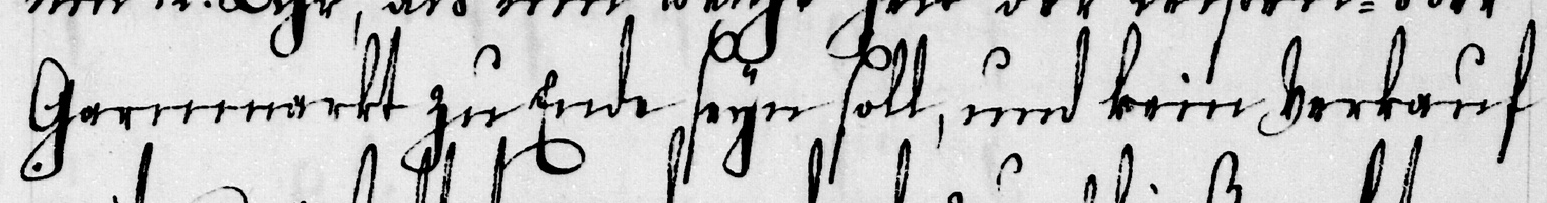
Garnmarkt zu Ende seyn soll, und kein Verkauf
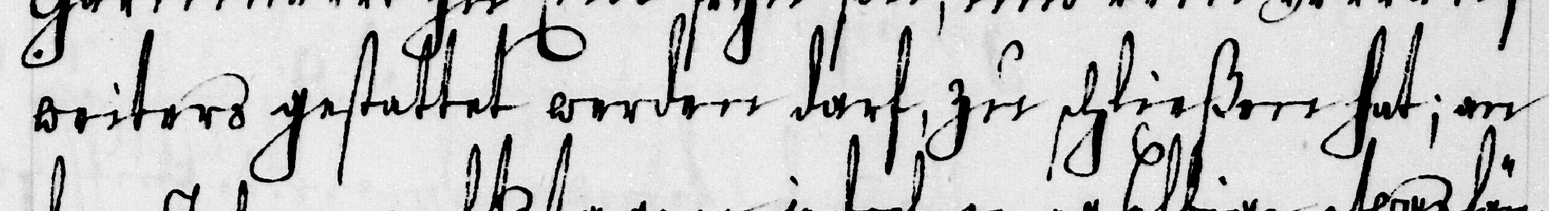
weiters gestattet werden darf, zu schließen hat; an
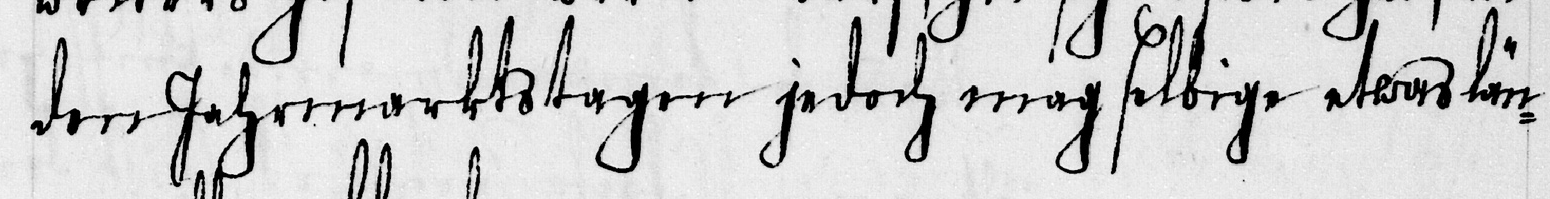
den Jahrmarktstagen jedoch mag selbige etwas län¬
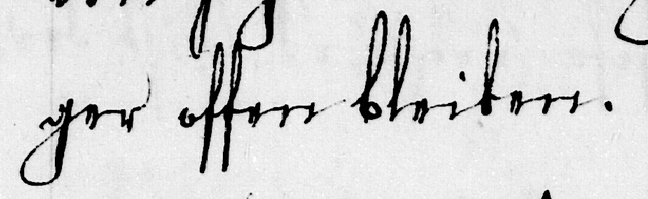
ger offen bleiben.
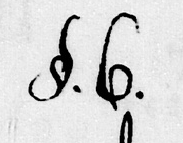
§. 6.
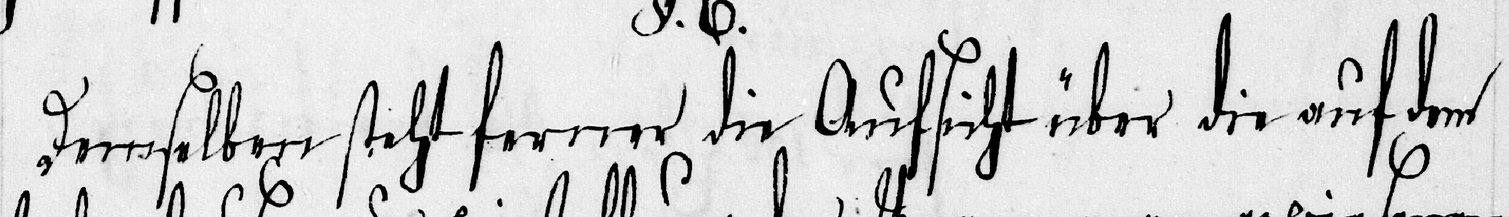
Demselben steht ferner die Aufsicht über die auf dem
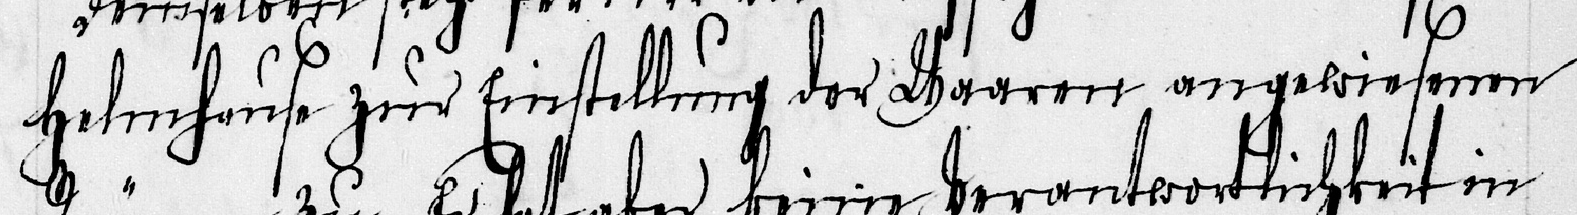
Helmhause zur Einstellung der Waaren angewiesenen
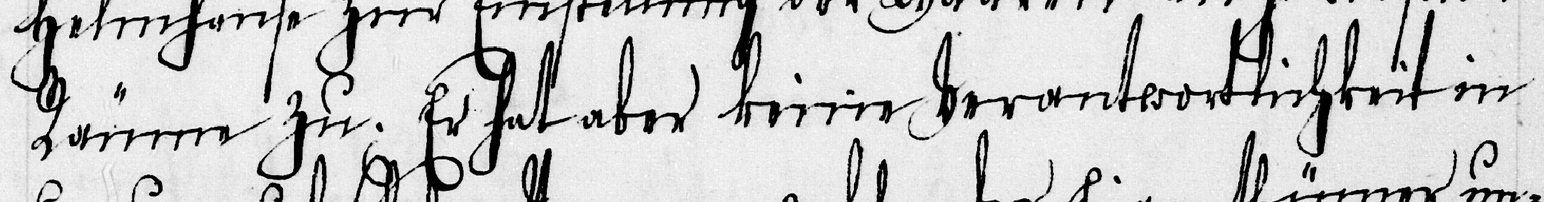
Räume zu. Er hat aber keine Verantwortlichkeit in
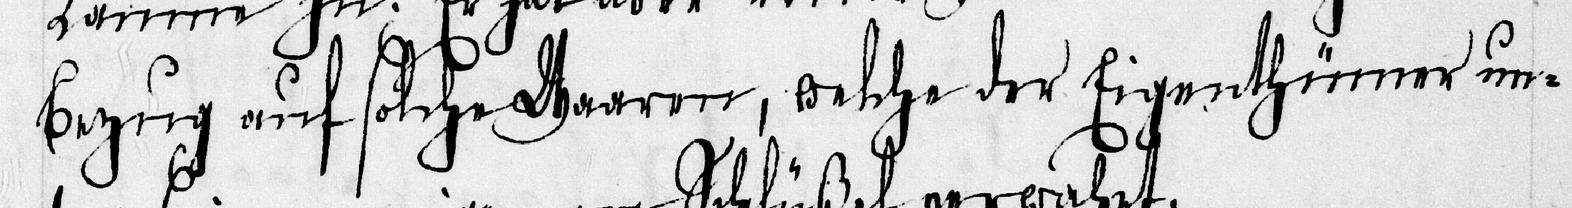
Bezug auf solche Waaren, welche der Eigenthümer un¬
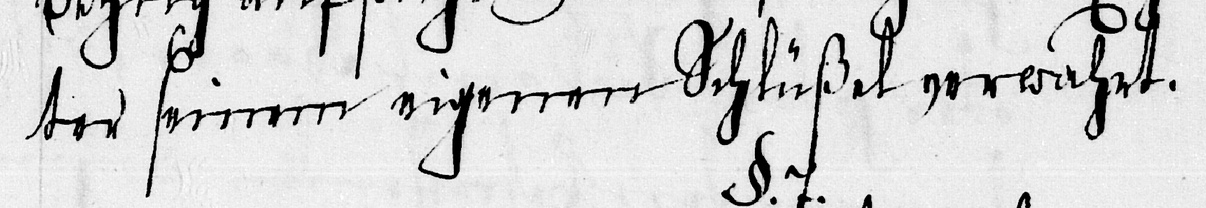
ter seinen eigenen Schlüßel verwahrt.
